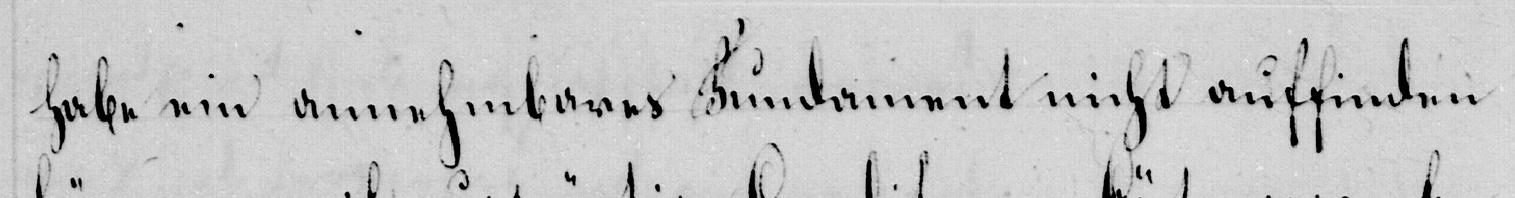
habe ein annehmbares Fundament nicht auffinden
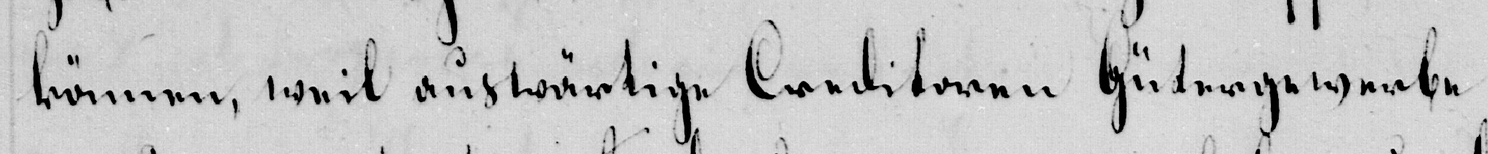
können, weil auswärtige Creditoren Gütergewerbe
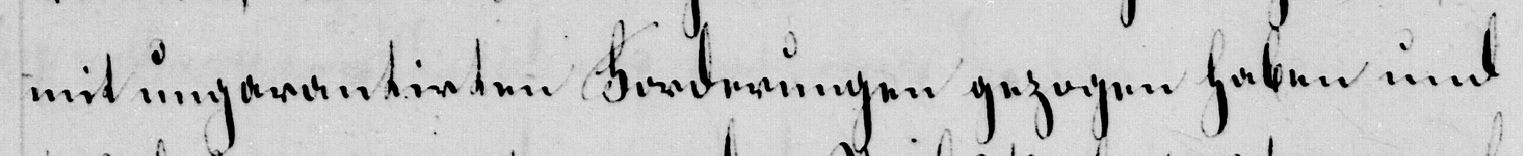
mit ungarantirten Forderungen gezogen haben und
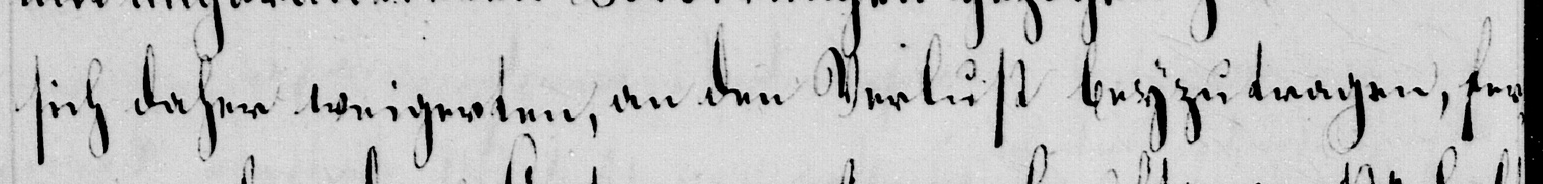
sich daher weigerten, an den Verlust beyzutragen, fer¬
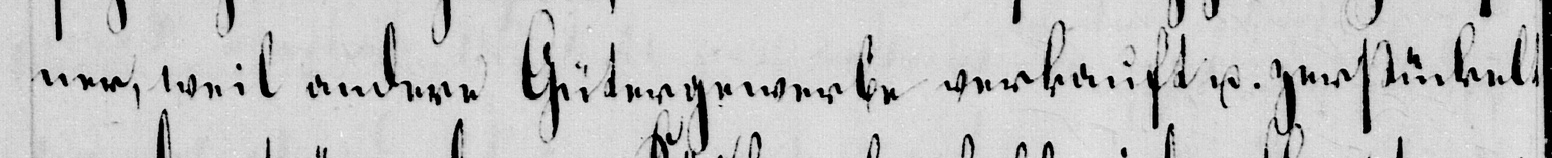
ner, weil andere Gütergewerbe verkauft u. zerstückelt
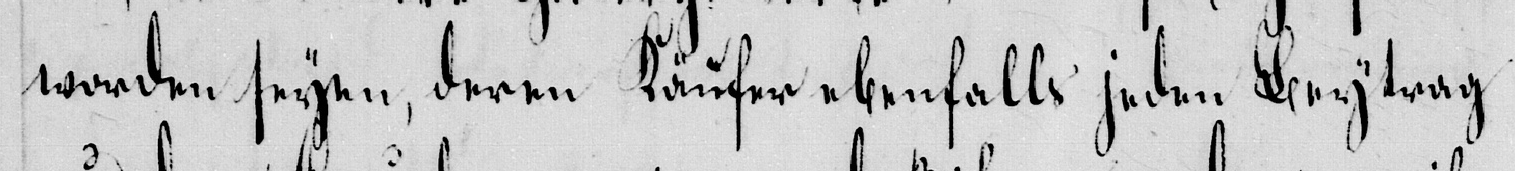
worden seyen, deren Käufer ebenfalls jeden Beytrag
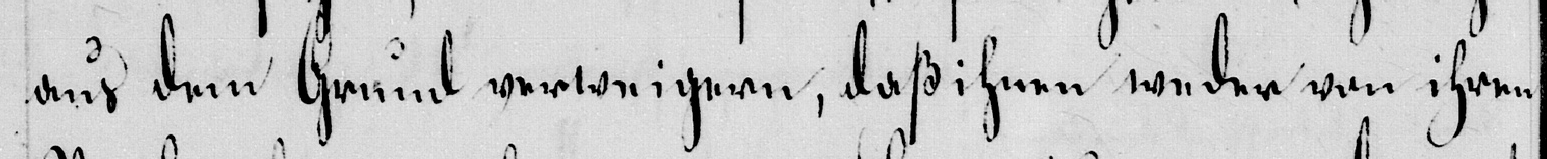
aus dem Grund verweigern, daß ihnen weder von ihren
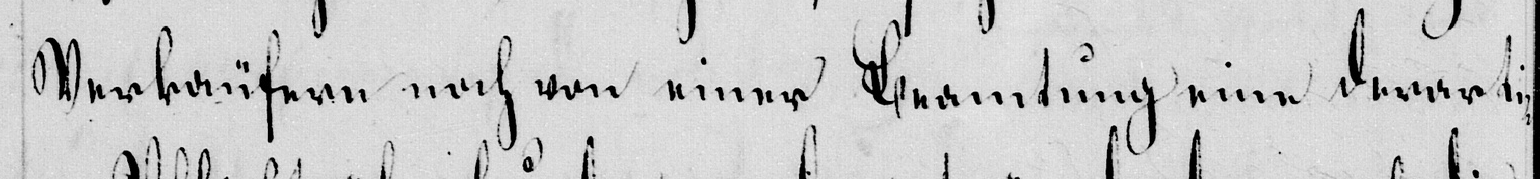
Verkäufern noch von einer Beamtung eine derart¬
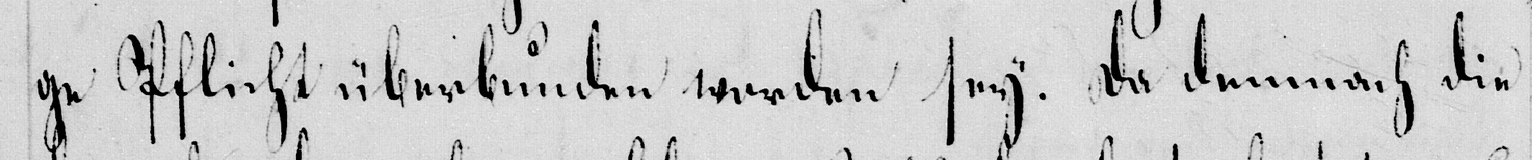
ige Pflicht überbunden worden sey. Da demnach die
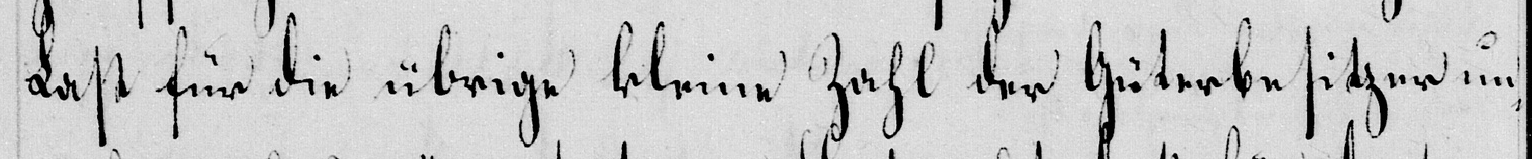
Last für die übrige kleine Zahl der Güterbesitzer un¬
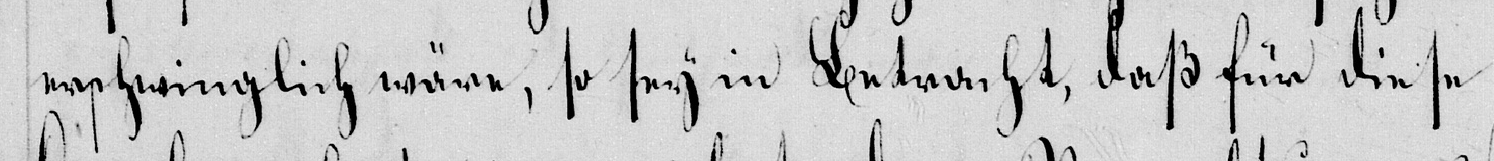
erschwinglich wäre, so sey in Betracht, daß für diese
